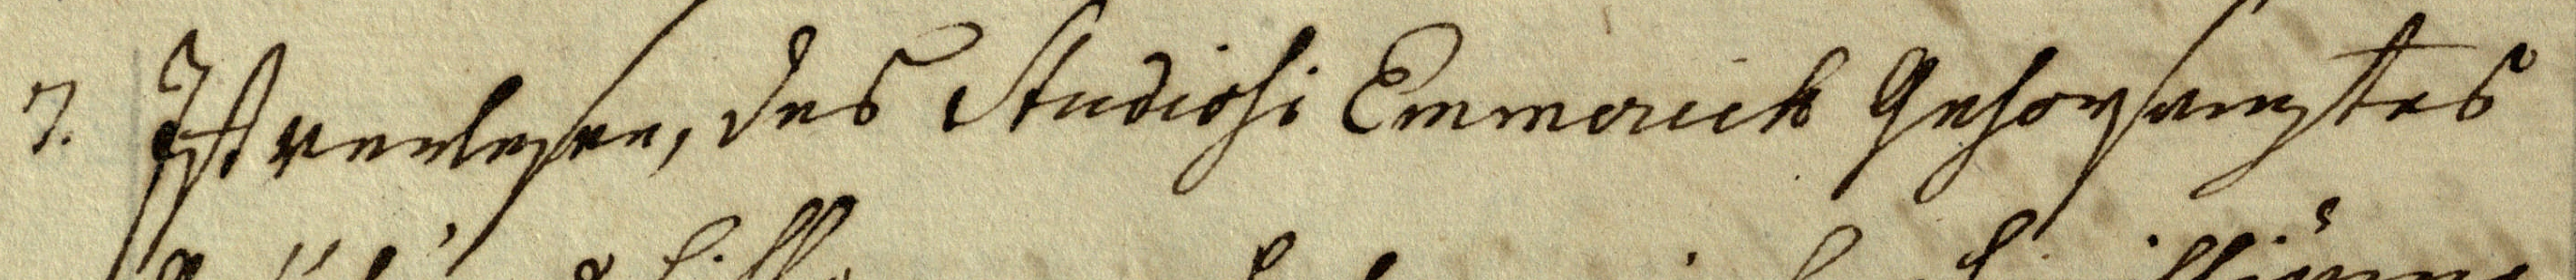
7. Ist verlesen, des Studiosi Emmerich gehorsamstes
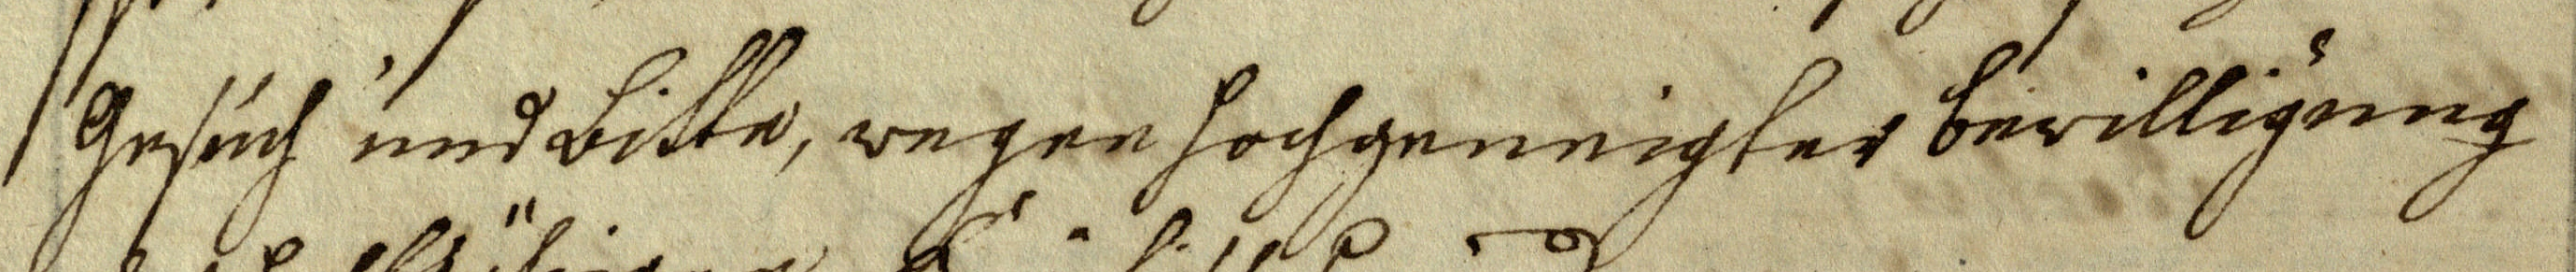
Gesuch und Bitte, wegen hochgeneigter Bewilligung
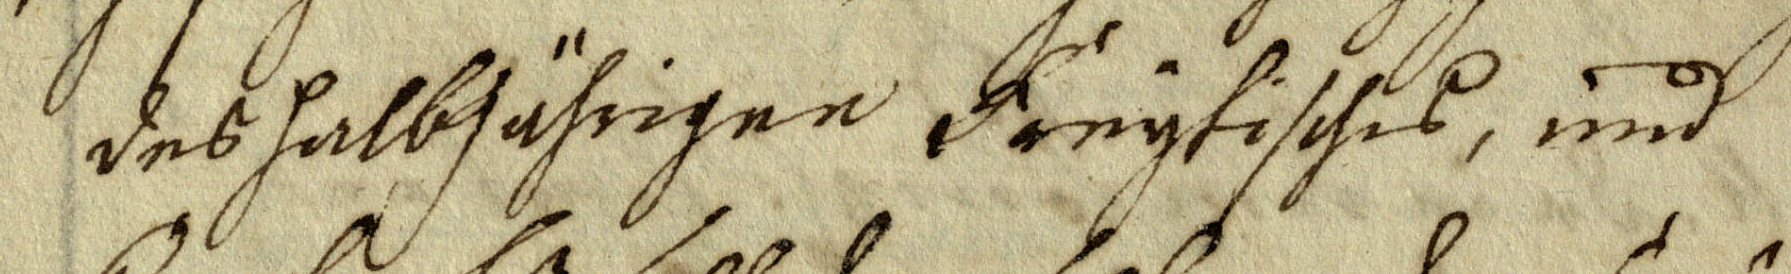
es halbjährigen Freÿtisches, und
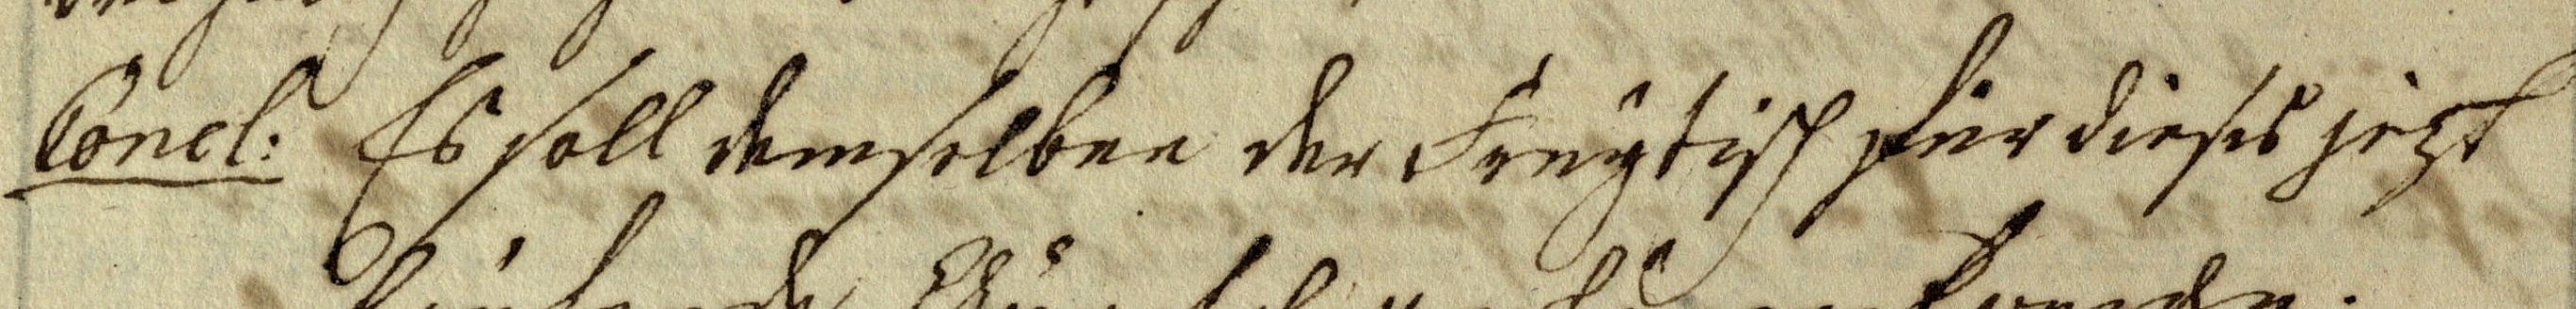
Concl. Es soll demselben der Freÿtisch für dieses jezt
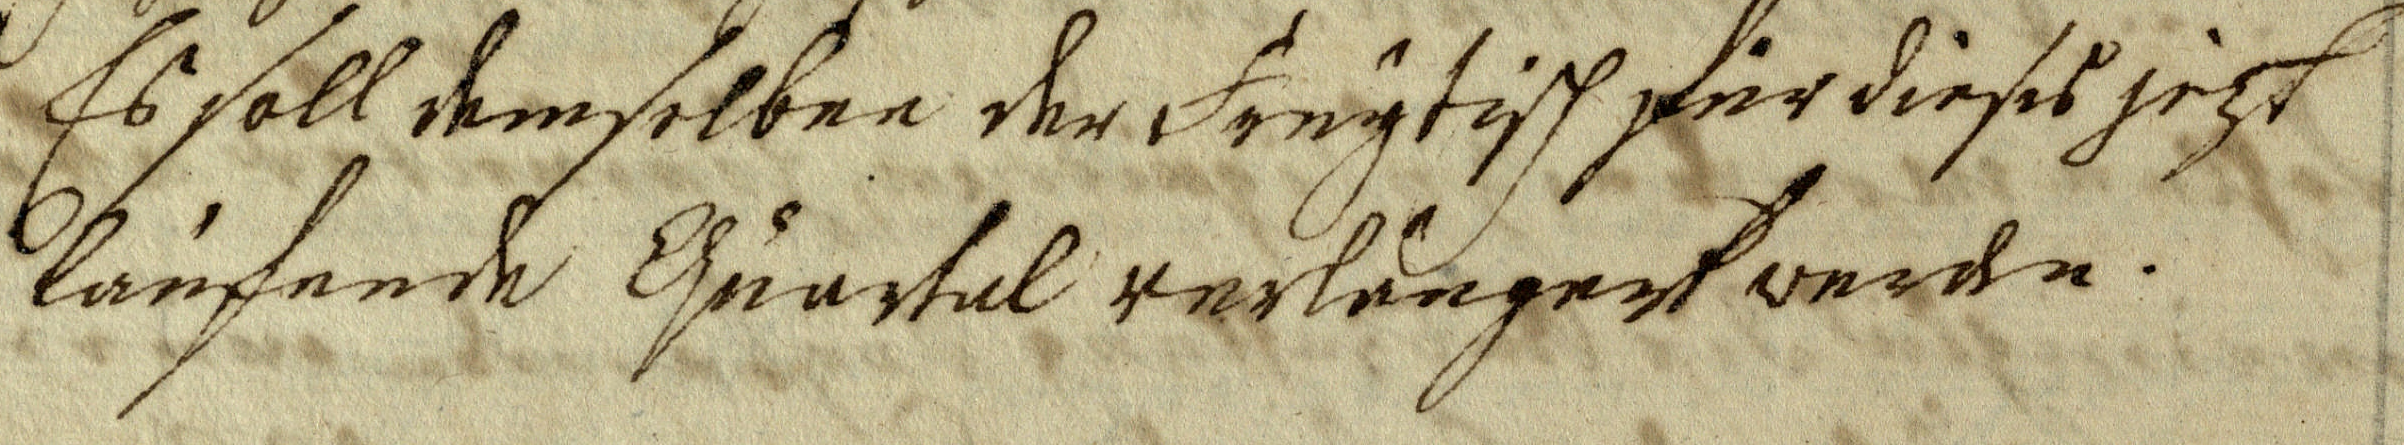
laufende Quartal verlängert werden.
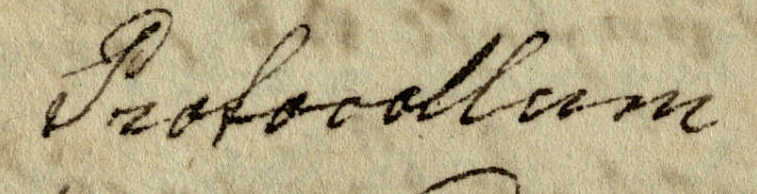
Protocollum
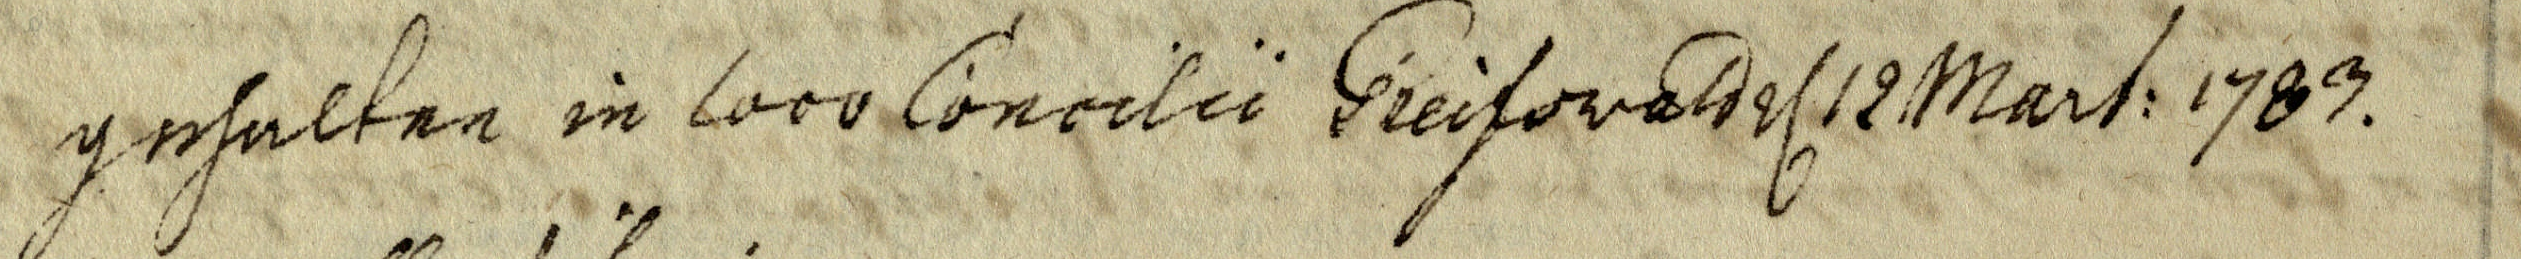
gehalten in loco Concilii Greifswald d 12 Mart. 1783.
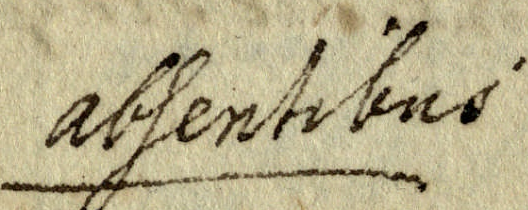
absentibus
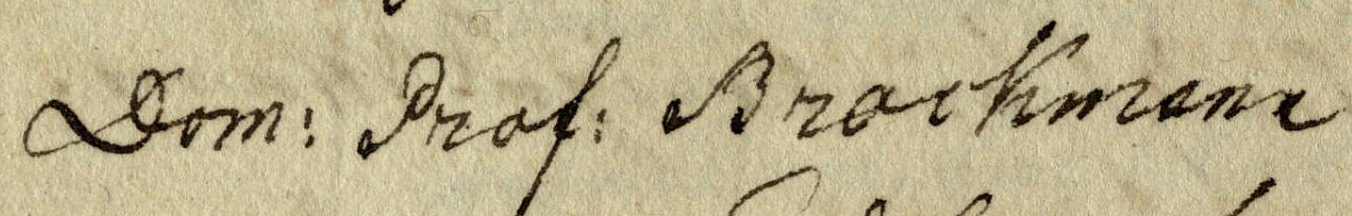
Dom. Prof. Brockmann
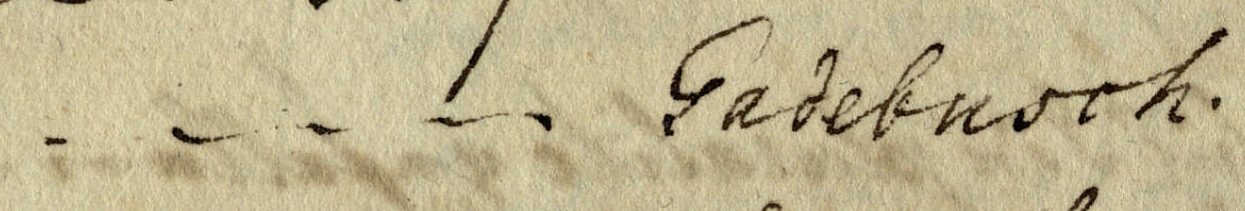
Gadebusch.
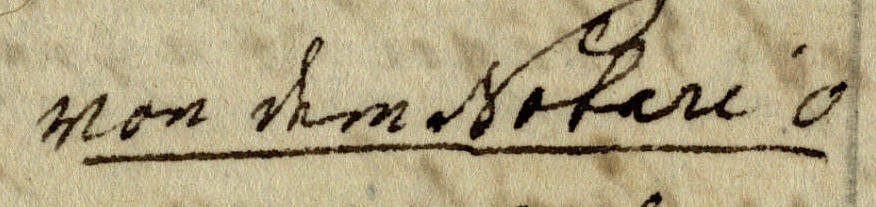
von dem Notario
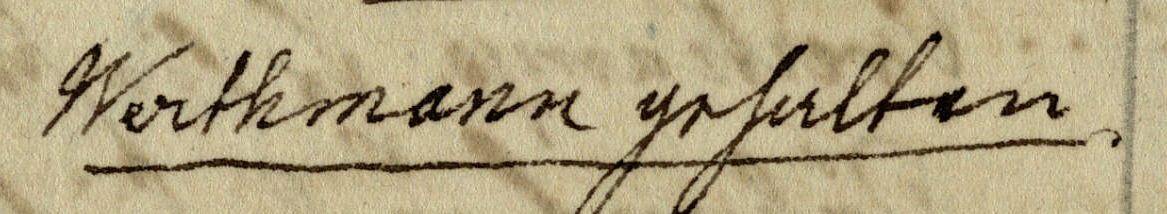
Werthmann gehalten.
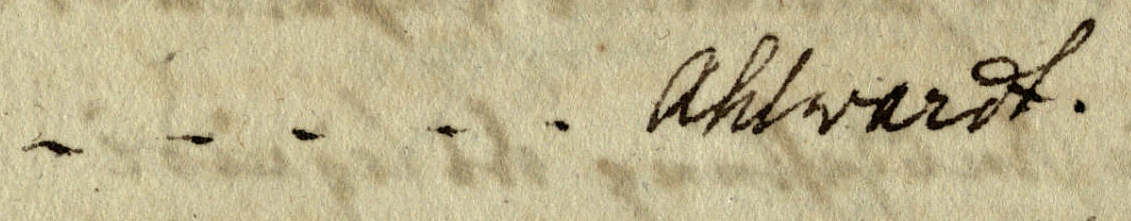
Ahlwardt.
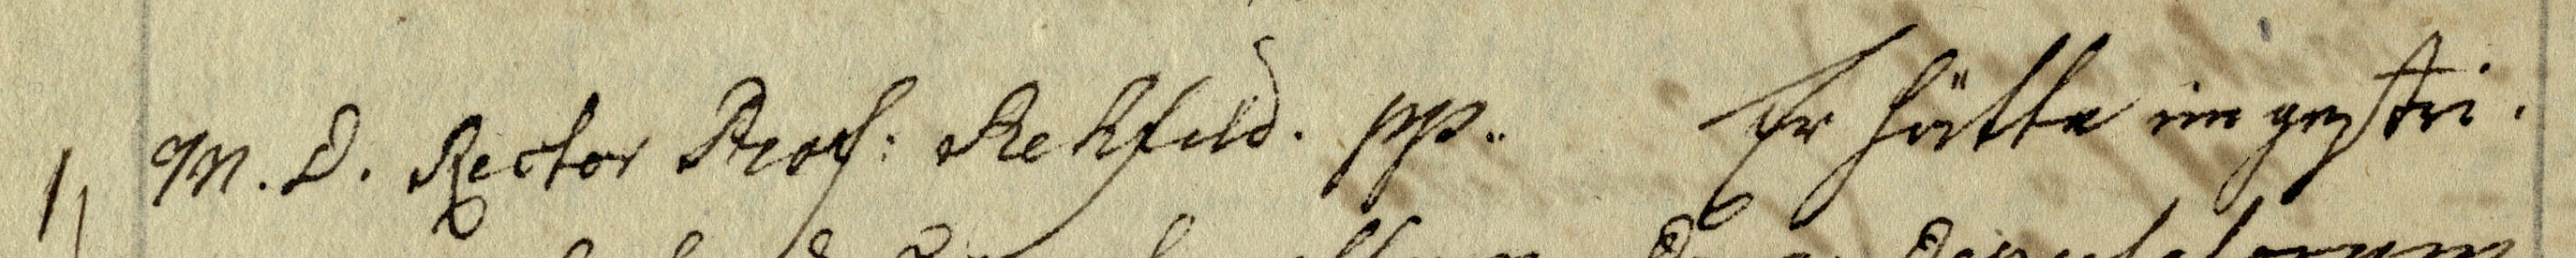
1, M. D. Rector Prof. Rehfeld pp. Er hätte im gestri¬
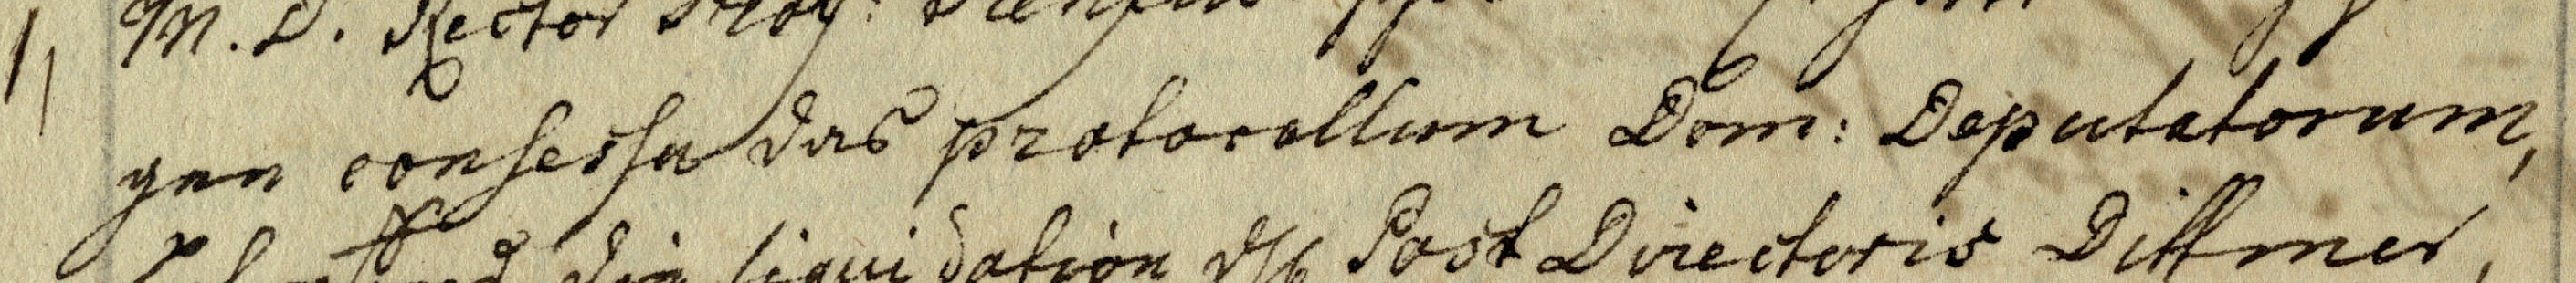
gen consessu das protocollum Dom. Deputatorum,
